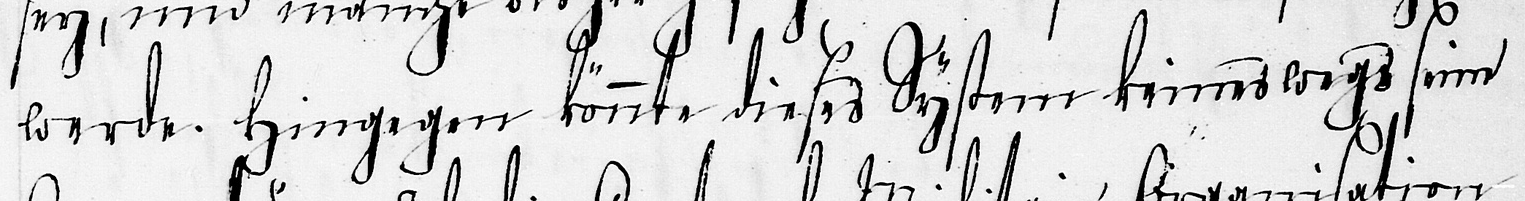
werde. Hingegen könnte dieses System keineswegs seine
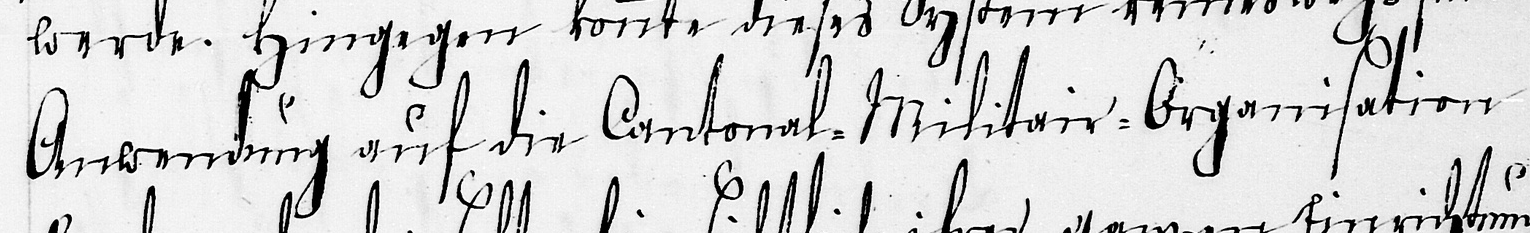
Anwendung auf die Cantonal-Militair-Organisation
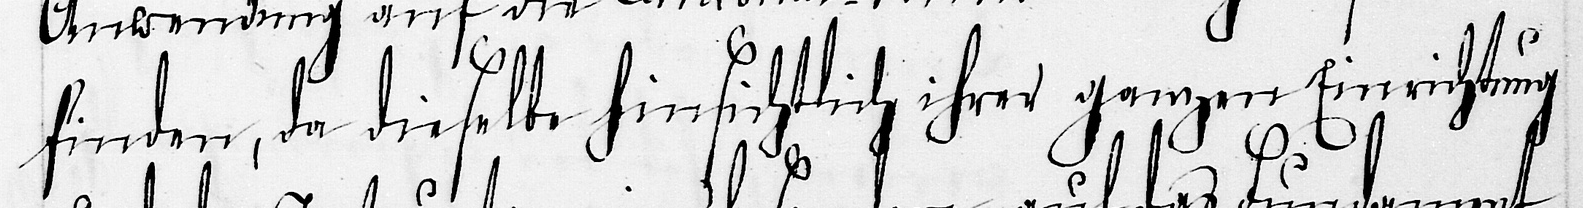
finden, da dieselbe hinsichtlich ihrer ganzen Einrichtung
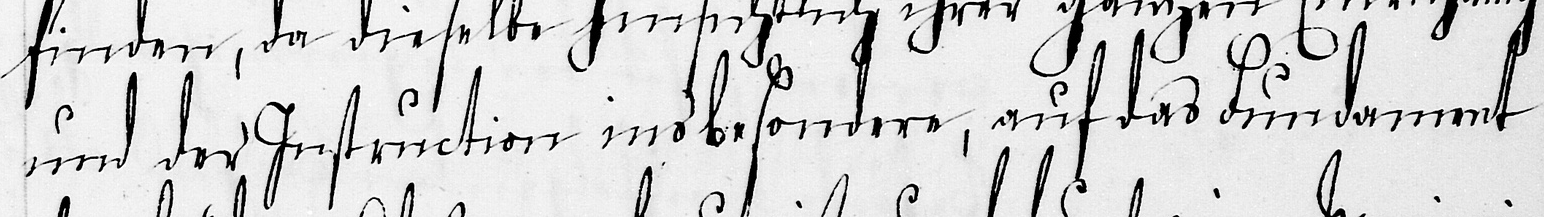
und der Instruction insbesondere, auf das Fundament
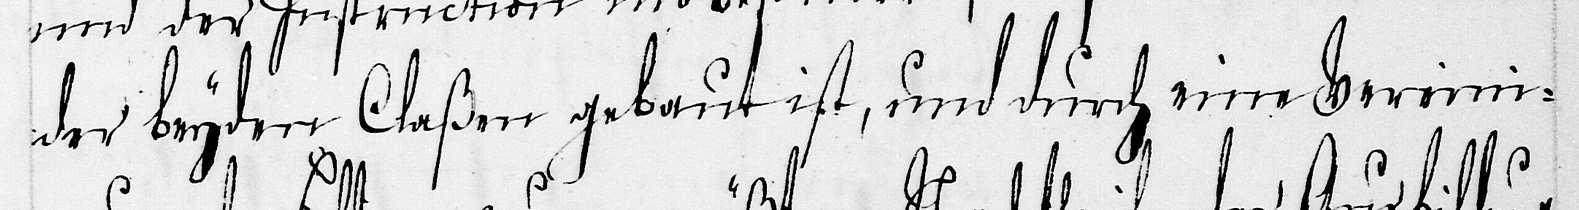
der beyden Claßen gebaut ist, und durch eine Vereini¬
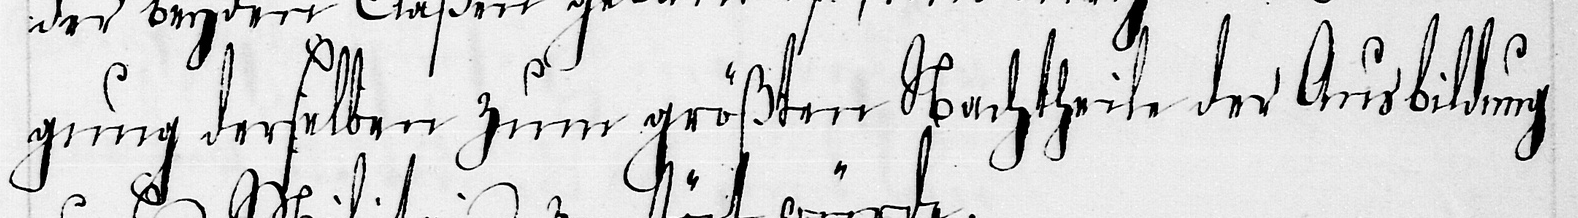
gung derselben zum größten Nachtheile der Ausbildung
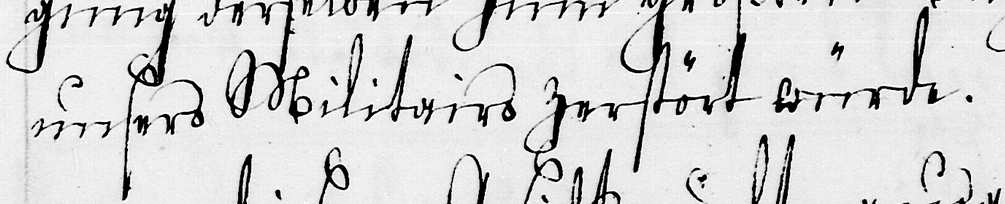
unsers Militairs zerstört würde.
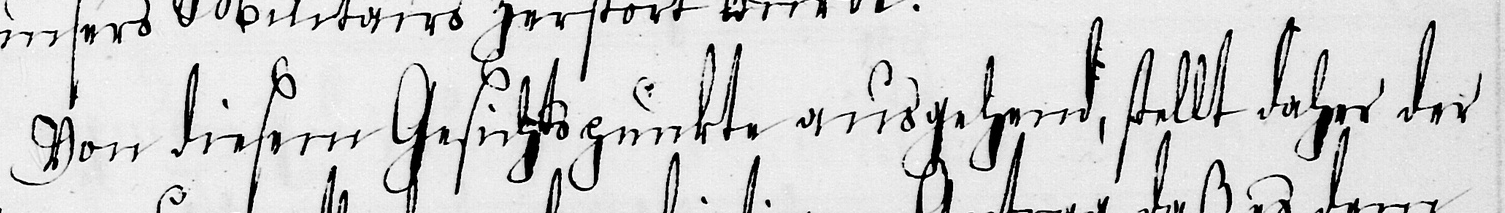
Von diesem Gesichtspunkte ausgehend, stellt daher der
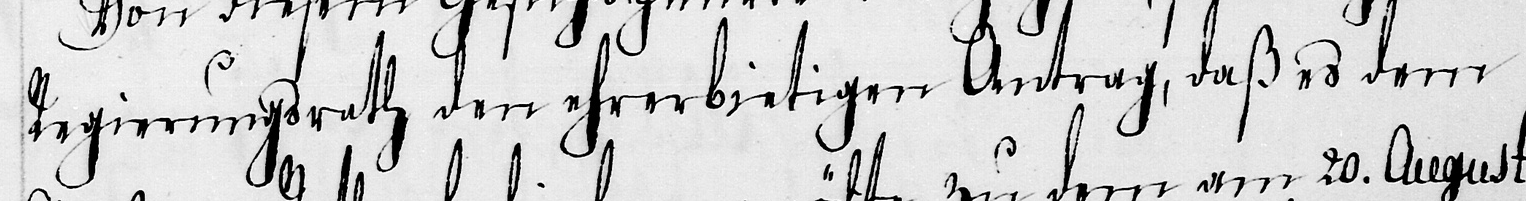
Regierungsrath den ehrerbietigen Antrag, daß es dem
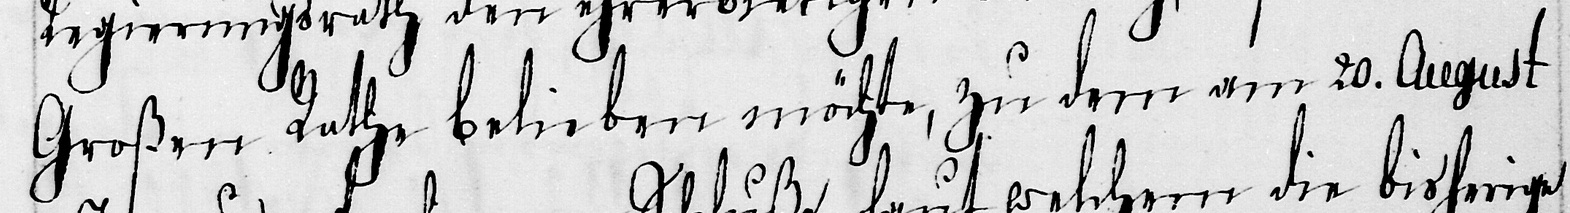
Großen Rathe belieben möchte, zu dem am 20. August
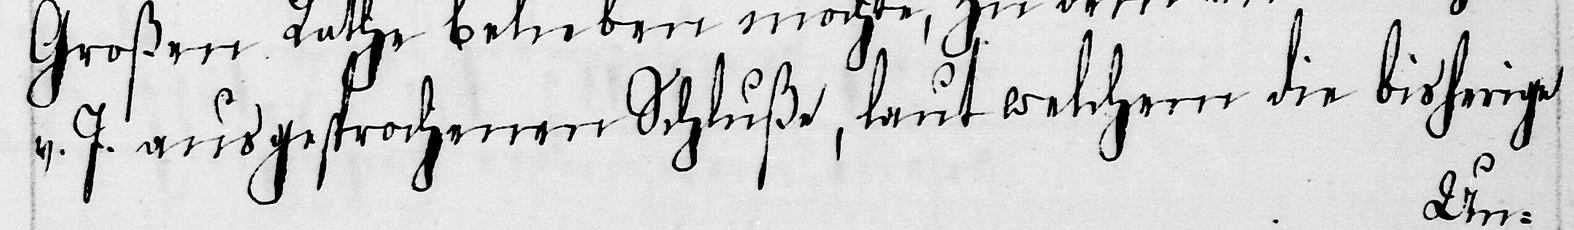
v. J. ausgesprochenen Schluße, laut welchem die bisherige
